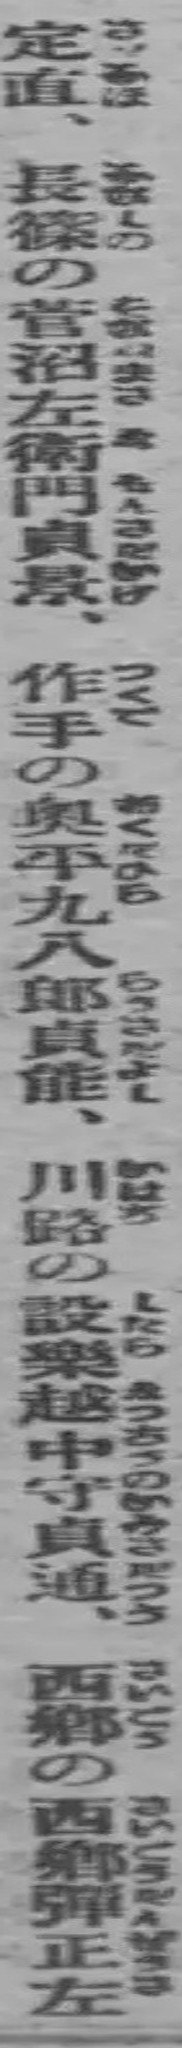定直、長篠の菅沼左衛門貞景、作手の奥平九八郎貞能、川路の設楽越中守貞通、西郷の西郷弾正左
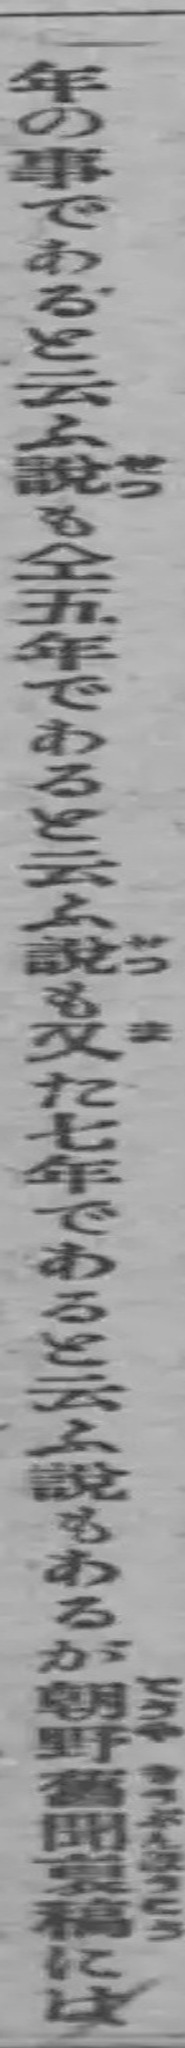す年の事であると云ふ説も仝五年であると云ふ説も又た七年であると云ふ説もあるが朝野旧聞裒稿には
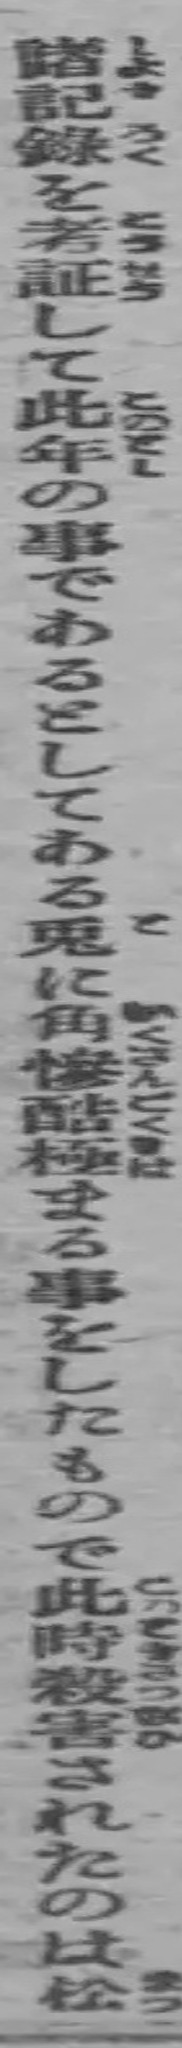諸記録を考証して此年の事であるとしてある兎に角惨酷極まる事をしたもので此時殺害されたのは松
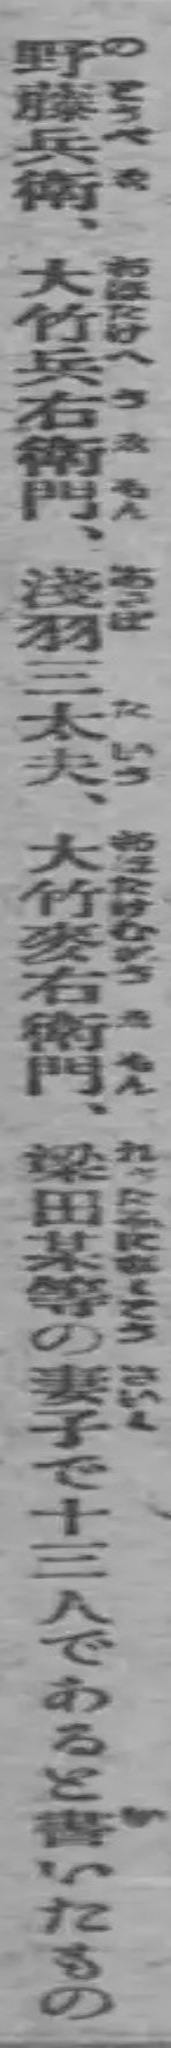野藤兵衛、大竹兵右衛門、浅羽三太夫、大竹麦右衛門、梁田某等の妻子で十三人であると書いたもの

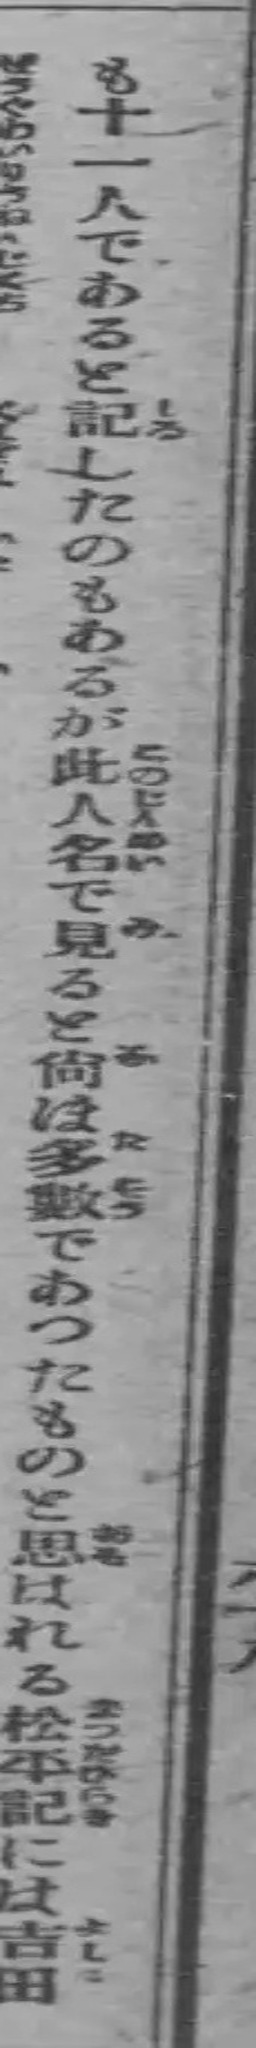も十一人であると記したのもあるが此人名で見ると尚ほ多数であつたものと思はれる松平記には吉田
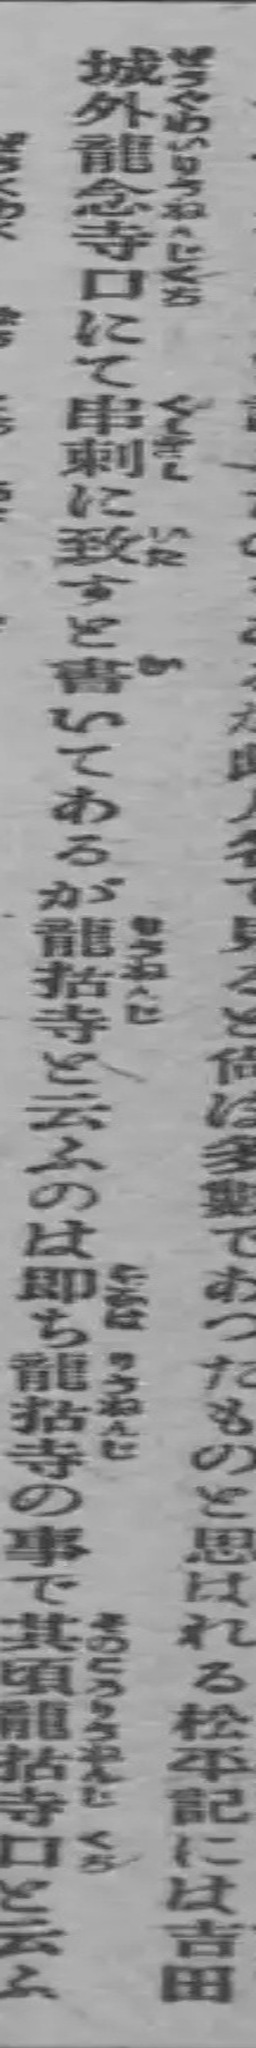城外龍念寺口にて串刺に致すと書いてあるが龍拈寺と云ふのは即ち龍拈寺の事で其頃龍拈寺口と云ふ
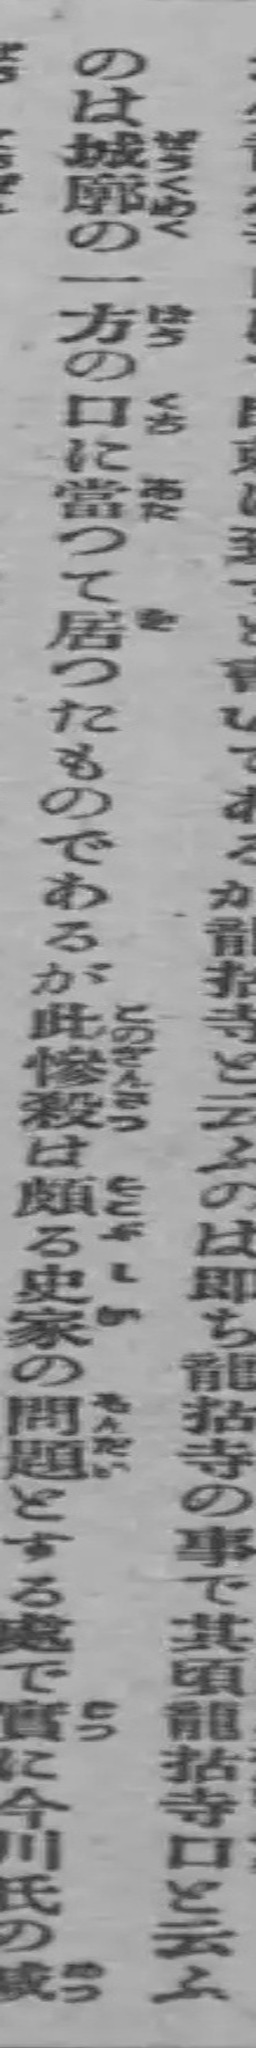のは城廓の一方の口に当つて居つたものであるが此惨殺は頗る史家の問題とする処で実に今川氏の滅
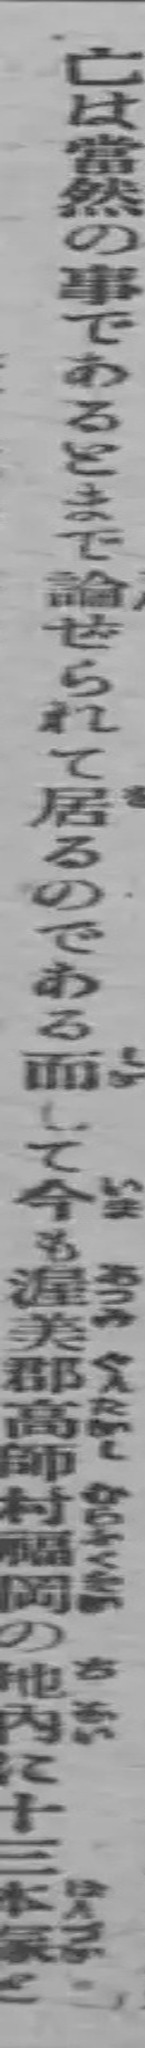亡は当然の事であるとまで論ぜられて居るのである而して今も渥美郡高師村福岡の地内に十三本塚と
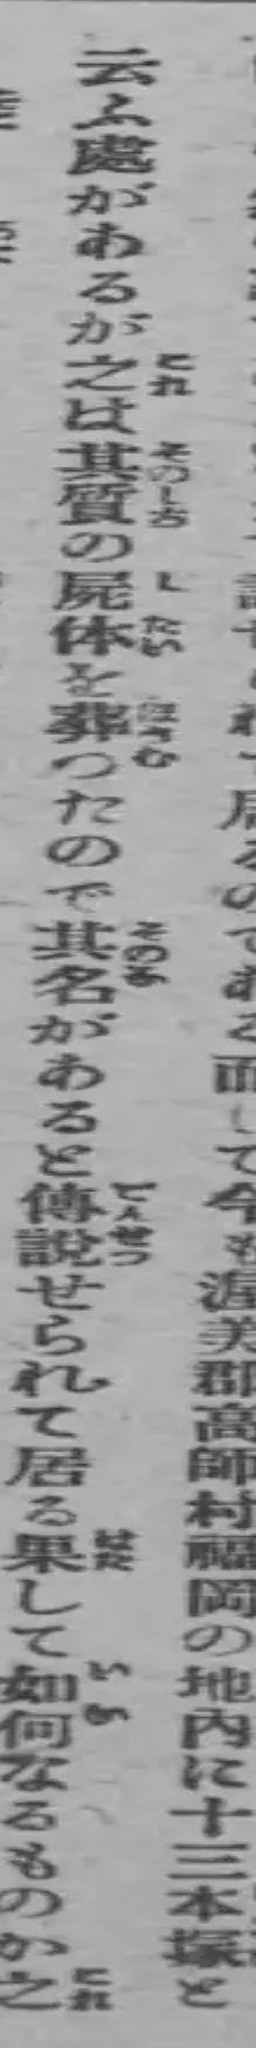云ふ処があるが之は其質の屍体を葬つたので其名があると伝説せられて居る果して如何なるものか之
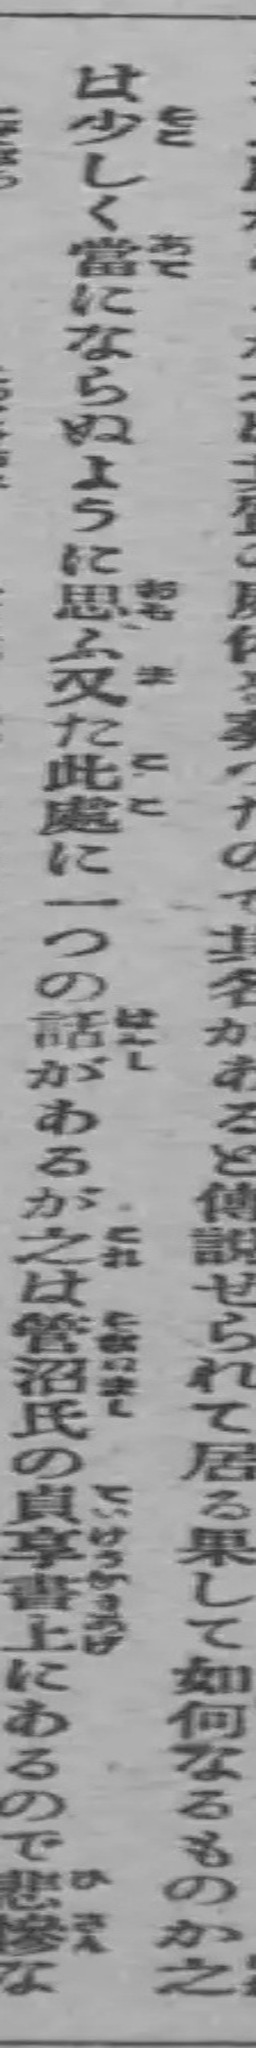は少しく当にならぬように思ふ又た此処に一つの話があるが之は菅沼氏の貞享書上にあるので悲惨な
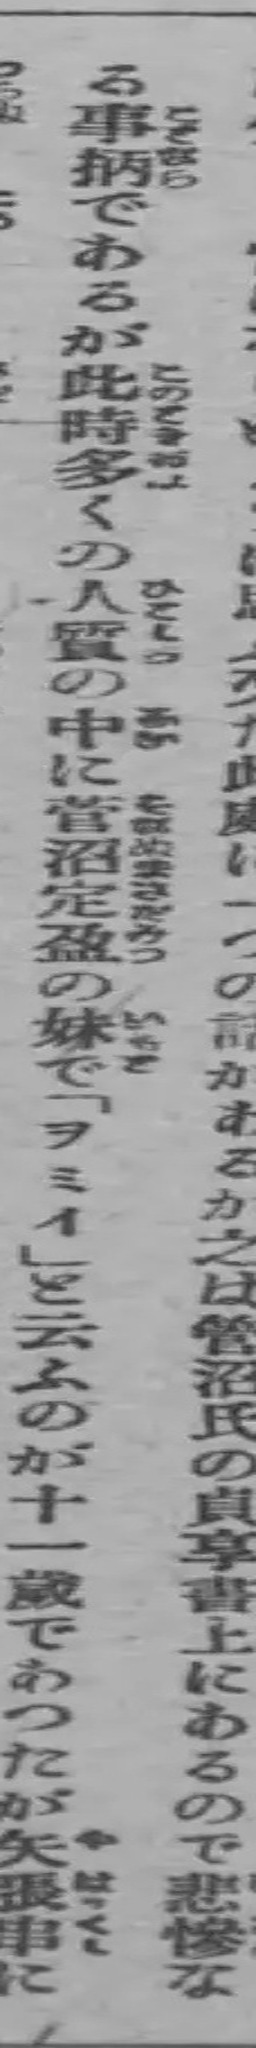菅沼定盈の妹る事抦であるが此時多くの人質の中に菅沼定盈の妹で「ヲミイ」と云ふのが十一歳であつたが矢張串に
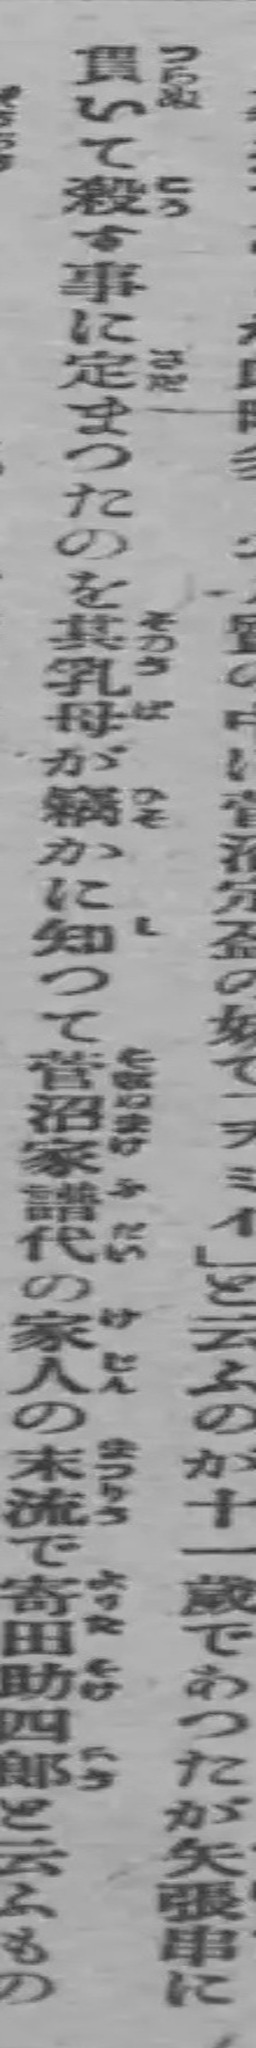貫いて殺す事に定まつたのを其乳母が竊かに知つて菅沼家譜代の家人の末流で寄田助四郎と云ふもの
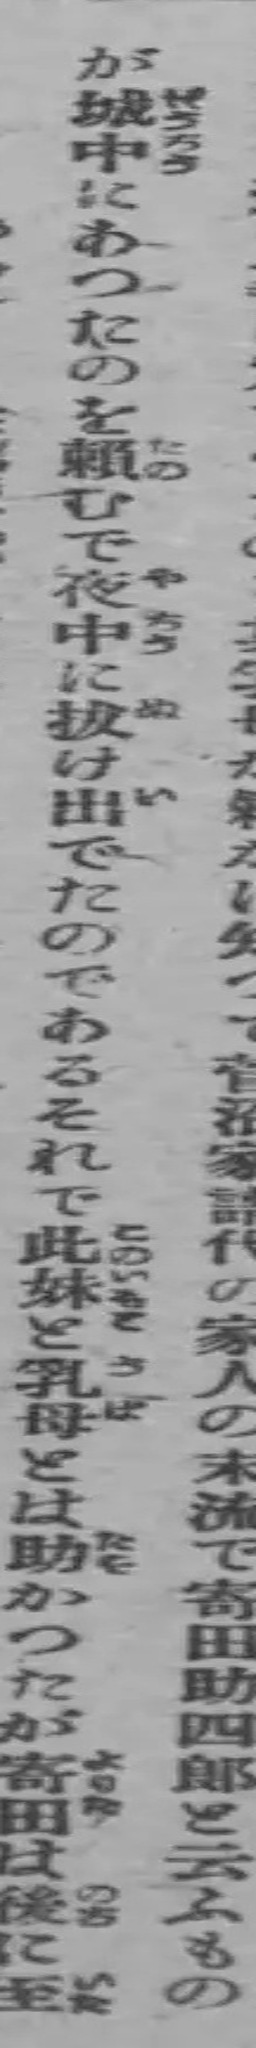が城中にあつたのを頼むで夜中に抜け出でたのであるそれで此妹と乳母とは助かつたが寄田は後に至
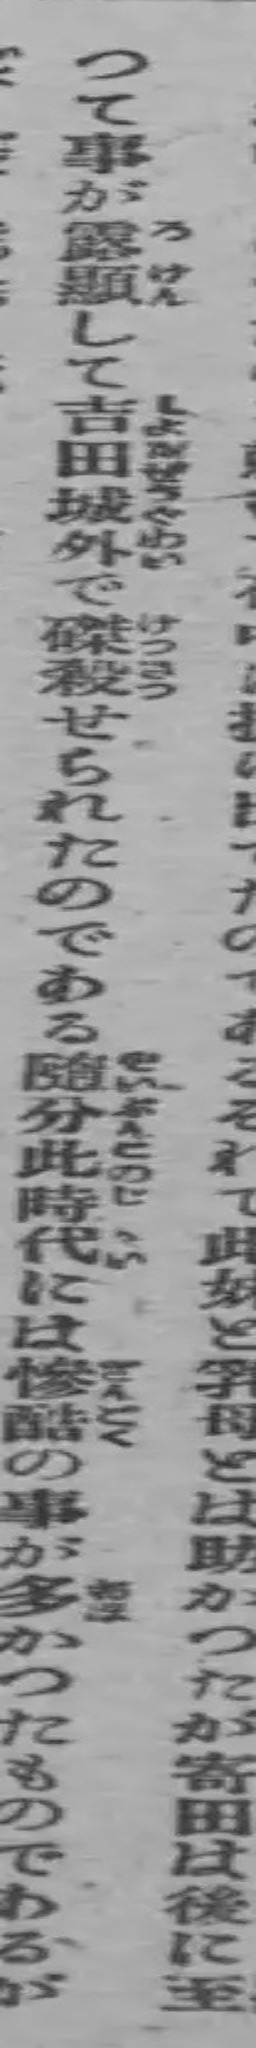つて事が露顕して吉田城外で磔殺せられたのである随分此時代には惨酷の事が多かつたものであるが
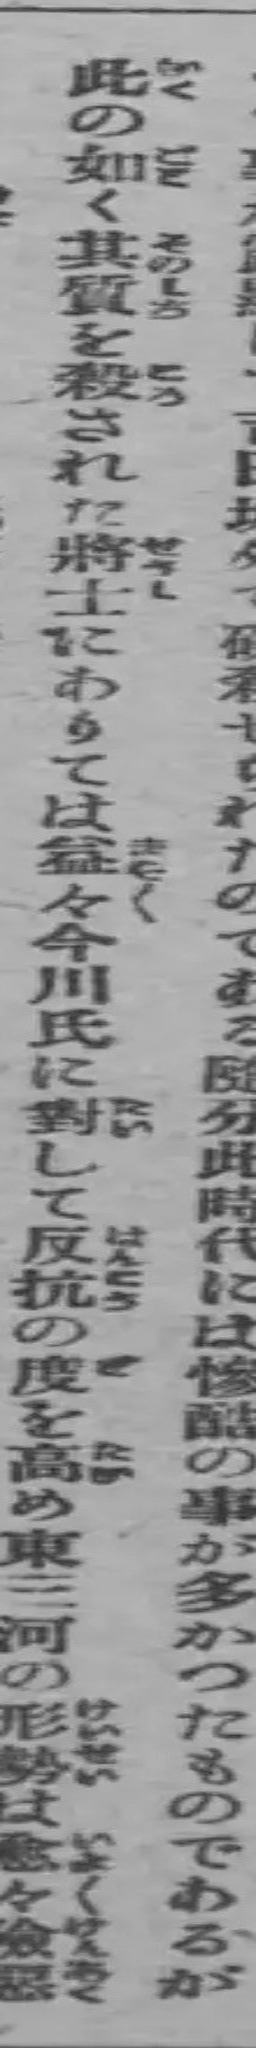此の如く其質を殺された将士にありては益々今川氏に対して反抗の度を高め東三河の形勢は愈々険悪
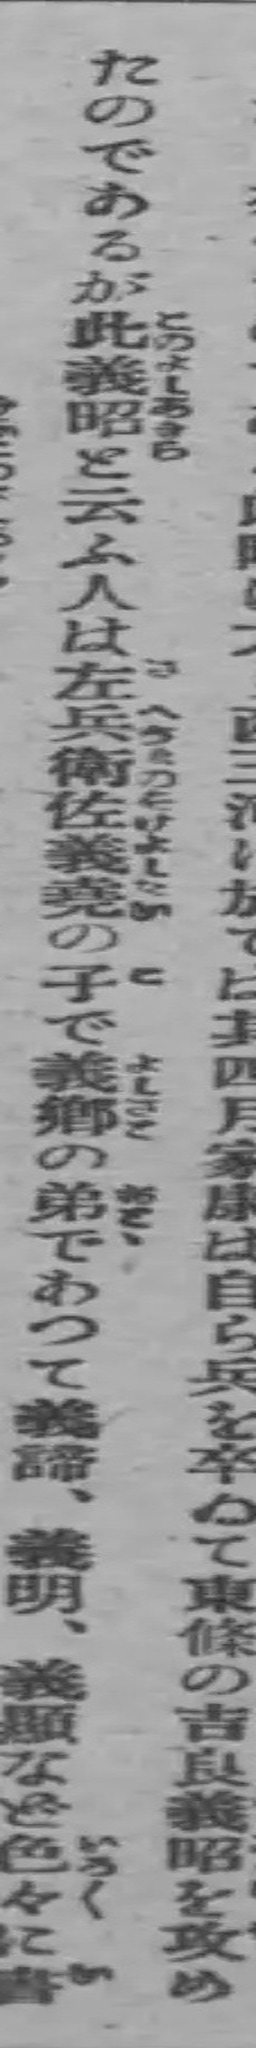たのであるが此義昭と云ふ人は左兵衛佐義尭の子で義郷の弟であつて義諦、義明、義顕など色々に書
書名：豊橋市史談
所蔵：国立国会図書館 National Diet Library, JAPAN
